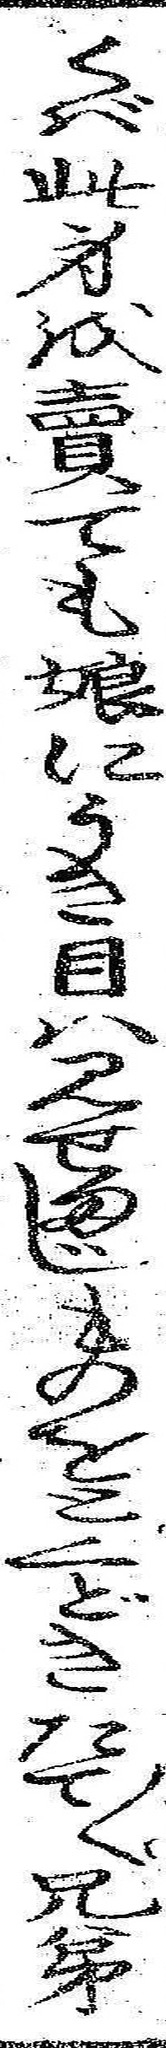くば。此身を売ても。娘にうき目は見せまじものをと。くどきたて〳〵。兄弟
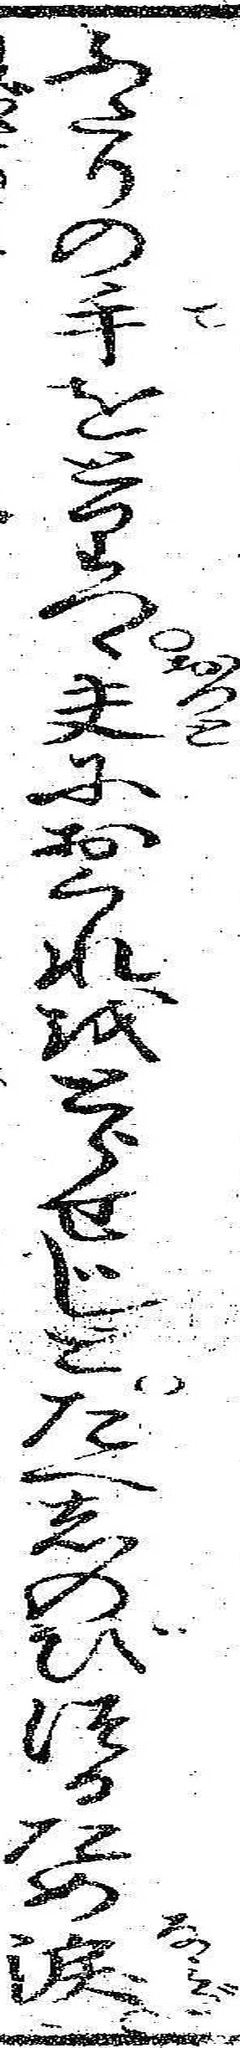ふたりの手をとりつゝ。夫におくれをとらせじと。たへしのびつるため涙。
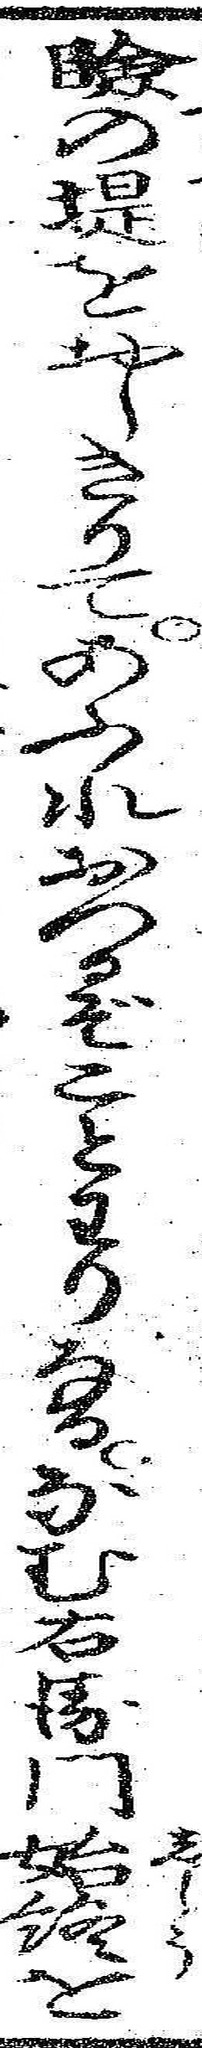瞼の堤をおしきりて。あふれおつるぞことわりなる。なむ右衛門始終を
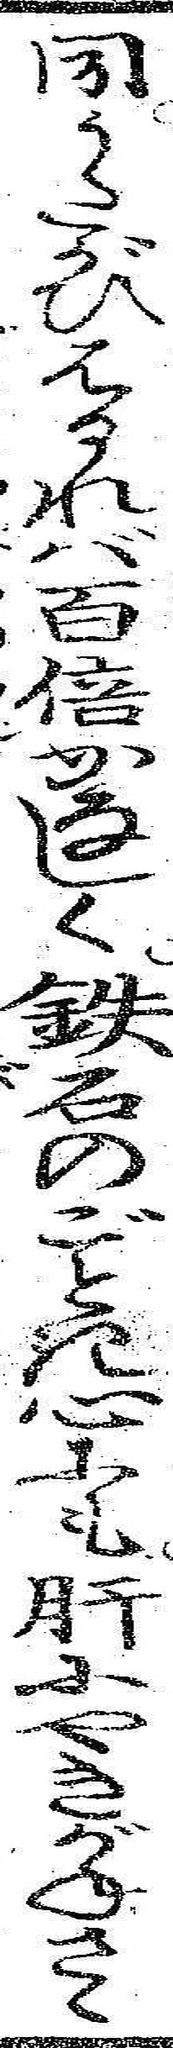聞。うたがひはるれば百倍かなしく。鉄石のごとき心にも。肝にやきがねさゝ
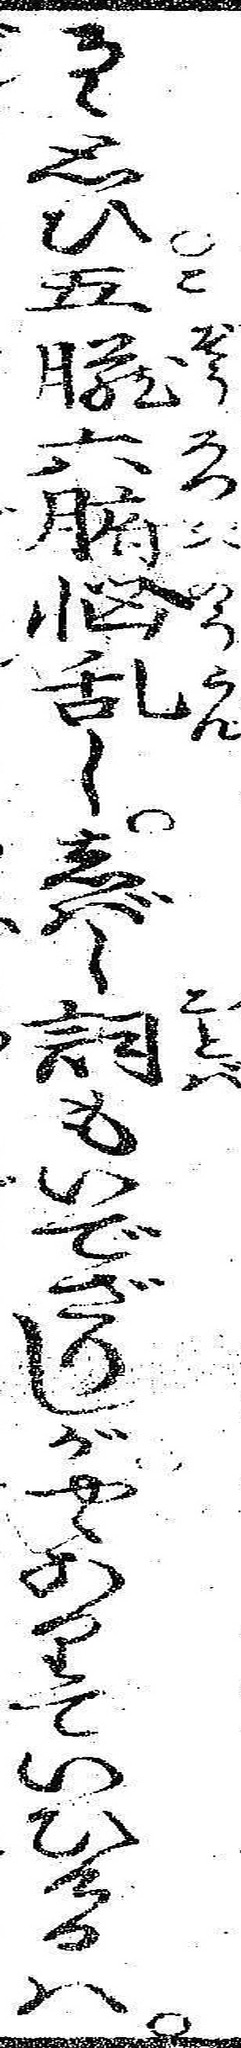るゝ思ひ。五臓六腑悩乱し。しばし詞もいでざりしが。やゝありていひけるは。
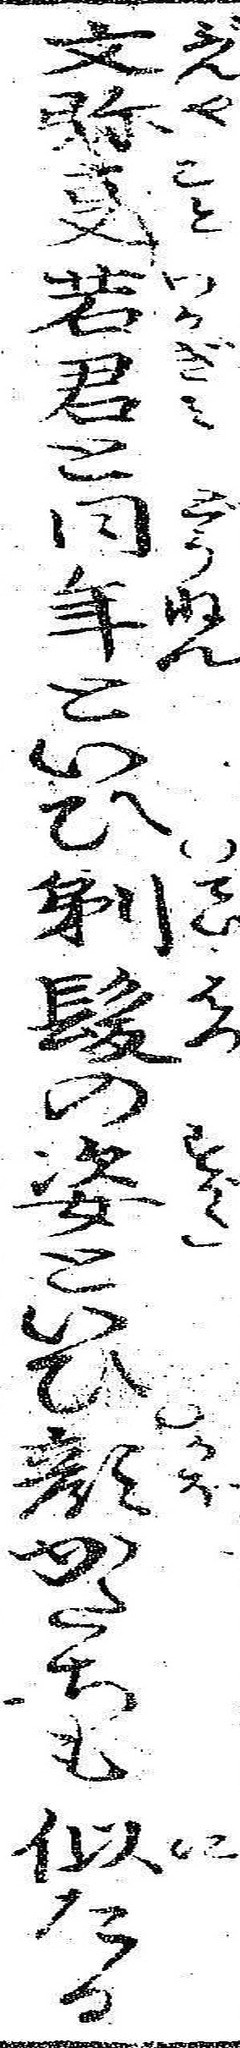文弥事若君と同年といひ。剃髪の姿といひ。顔かたちも似たる
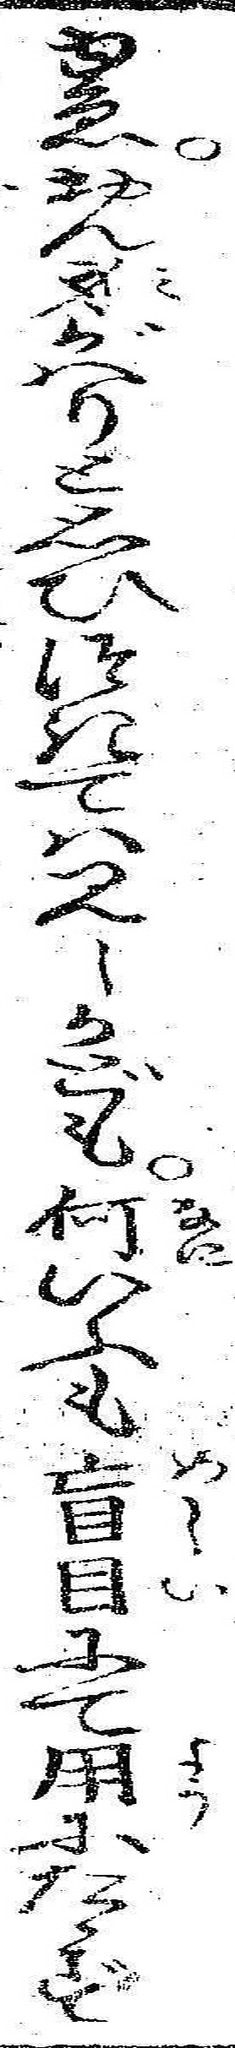ゆゑ。おん身がはりと思ひつきては見しかども。何いふも盲目にて用にたゝず
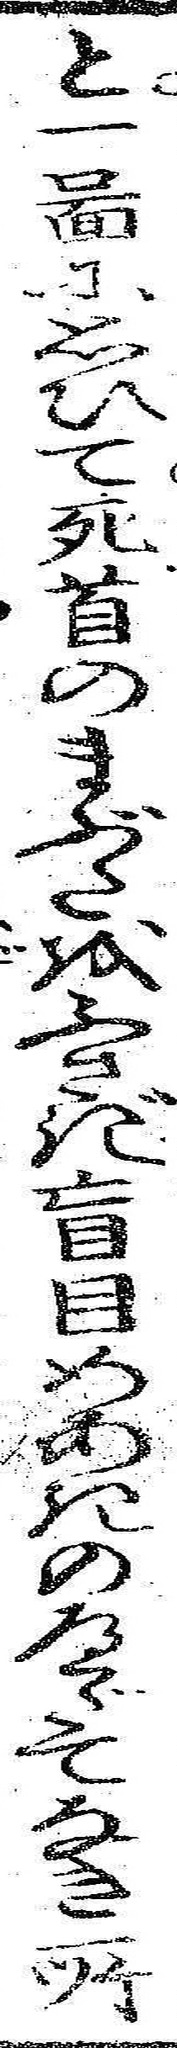と。一図に思ひて。死首のまぶたをふさぎ。盲目めあきのへだてなき所
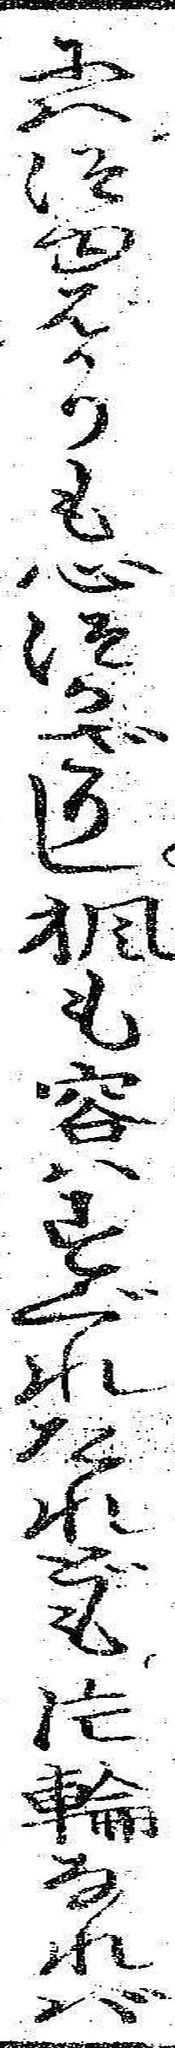にはつゆはかりも心つかざりし。楓も容はすぐれたれども。片輪なれば
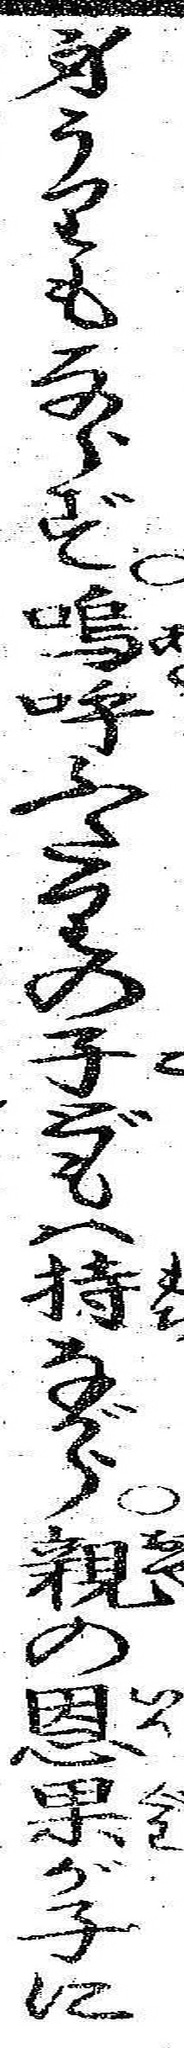身うりもならず。嗚呼ふたりの子どもは持ながら。親の恩果が子に
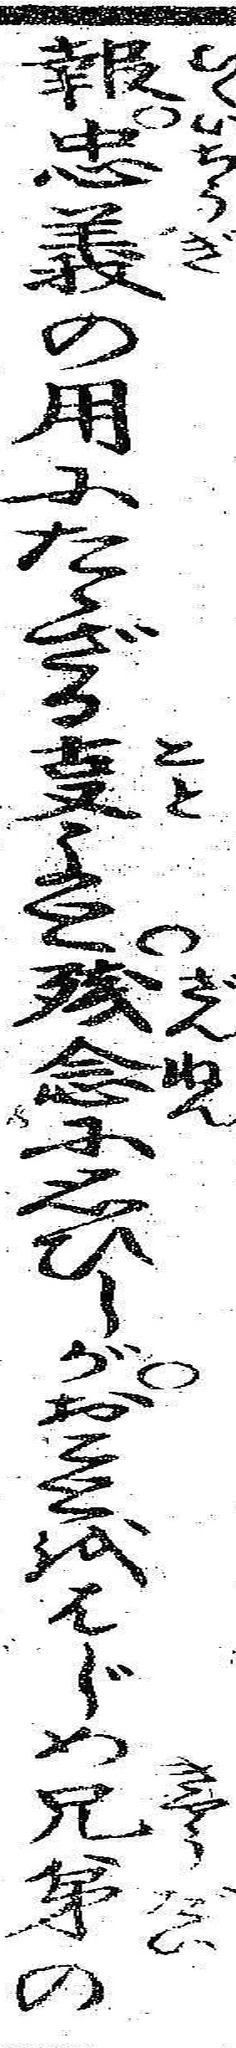報。忠義の用にたゝざる事よと。残念に思ひしが。おことをはじめ兄弟の
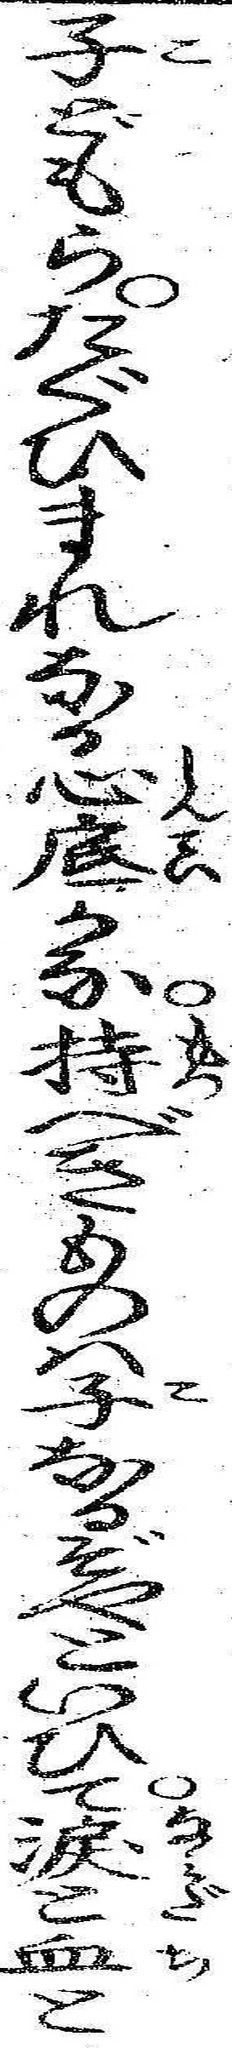子どもら。たぐひまれなる心底かな。持べきものは子なるぞやといひて。涙と血と
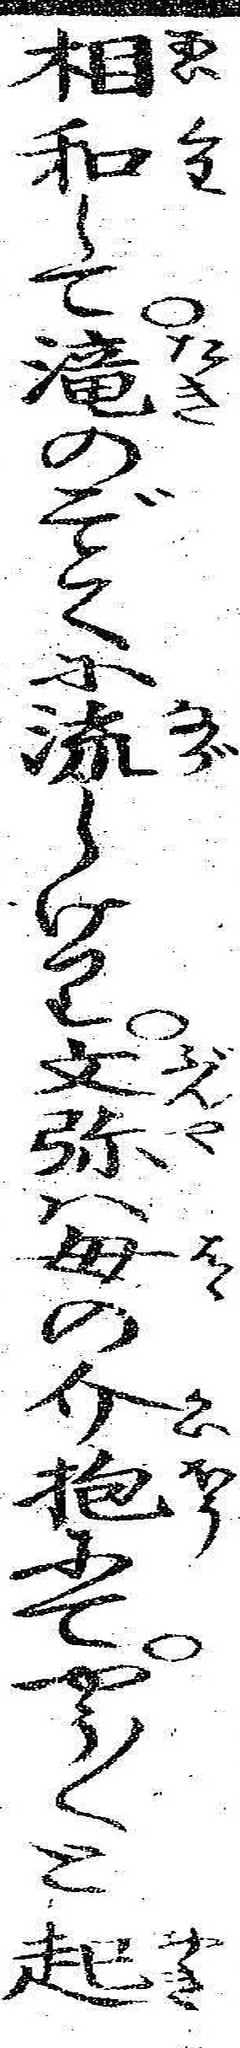相和して。滝のごとくに流しけり。文弥は母の介抱にて。やう〳〵と起
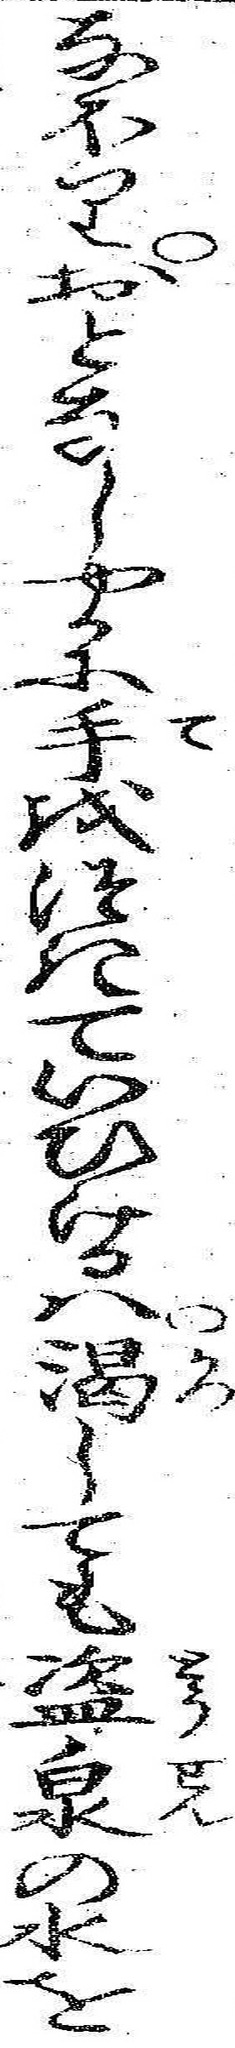なほり。おとなしやかに手をつきていひけるは。渇しても盗泉の水を
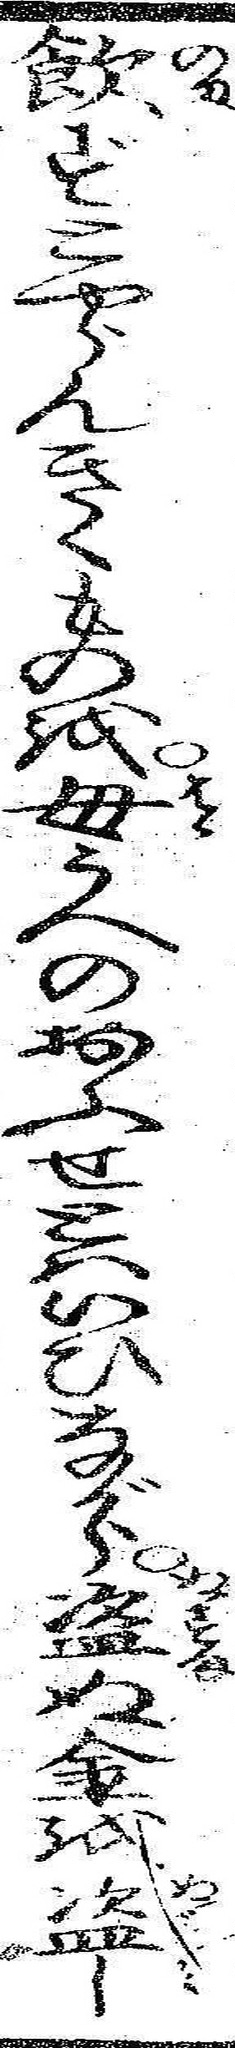飲ずとやらんきくものを。母うへのおふせとはいひながら。盗ぬ金を盗し
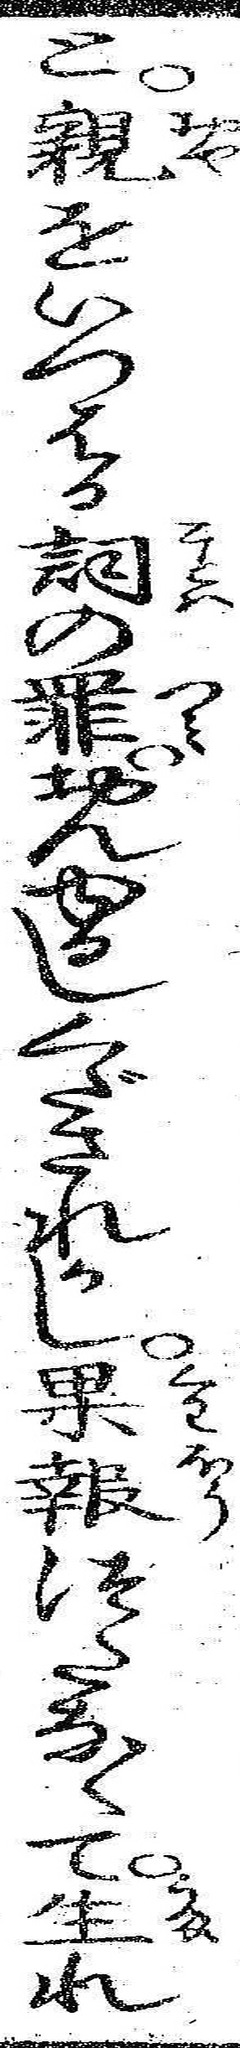と。親をいつはる詞の罪。おんゆるしくだされかし。果報つたなくて。生れ
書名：昔話稲妻表紙
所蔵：国文学研究資料館
